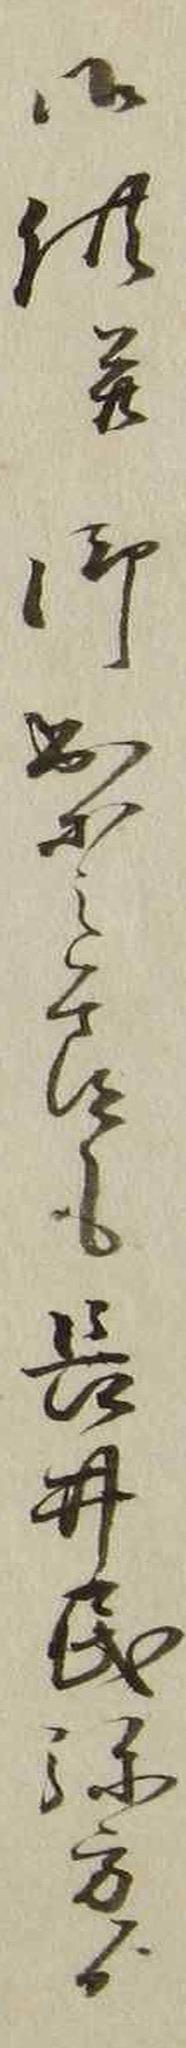御供并御出等之節も長井民弥方ゟ
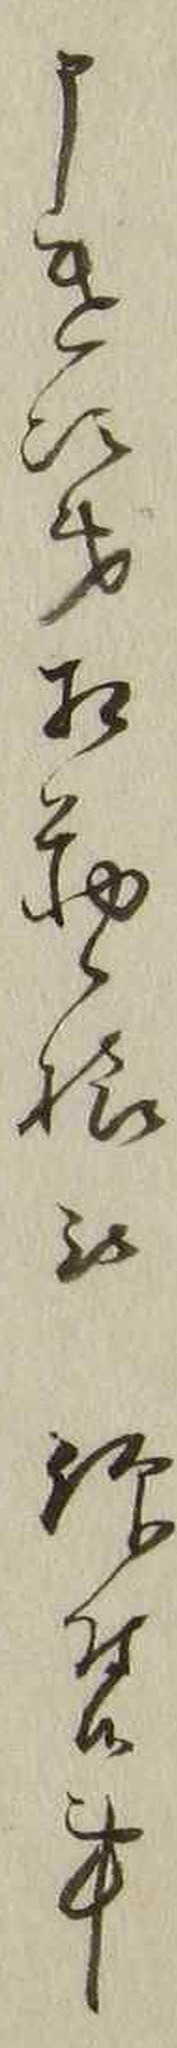申遣次第相勤候様被仰付候事
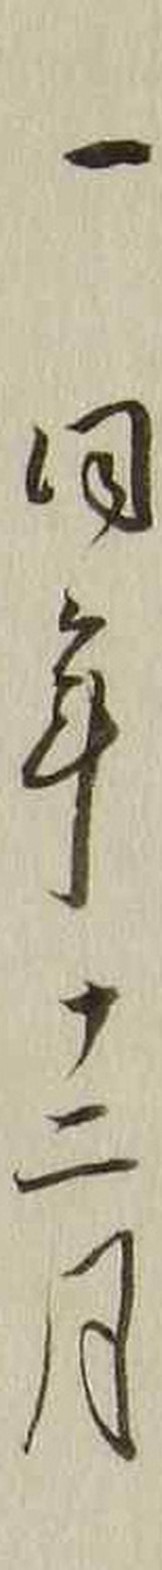一同年十二月
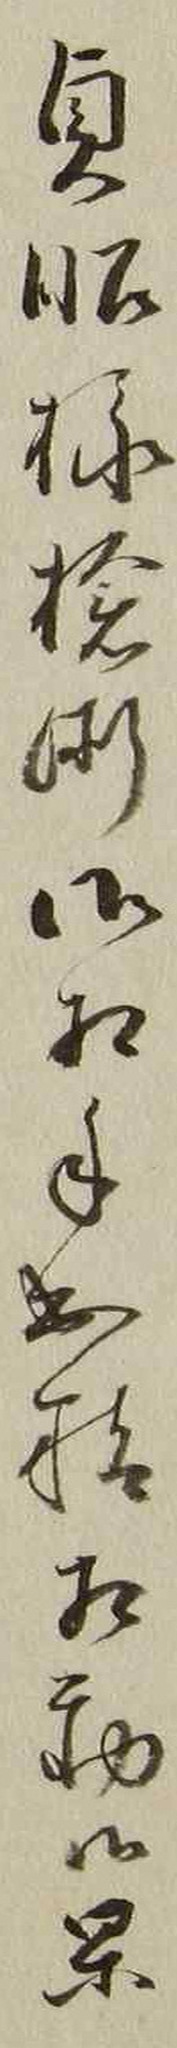貞昭様槍術御相手出精相勤御果
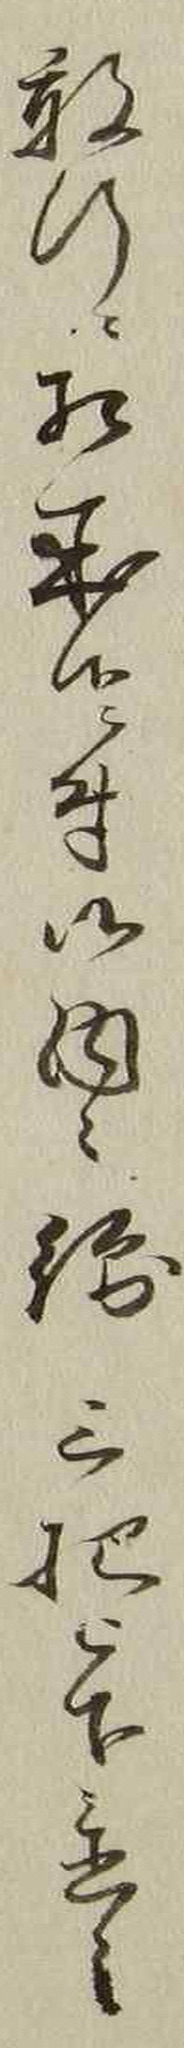敢行ニ相成候ニ付御内々綿三把被下置之
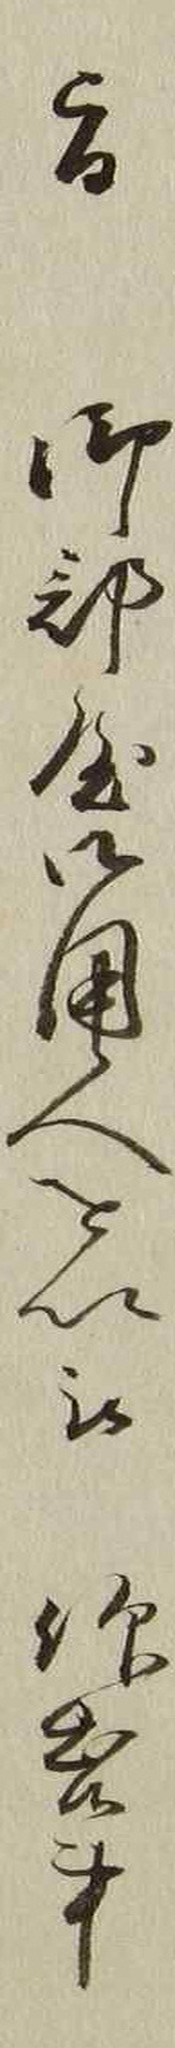旨御部屋御用人を以被仰出候事
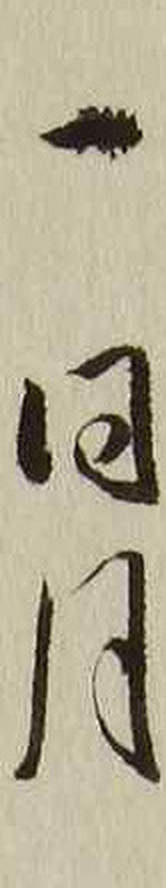一同月
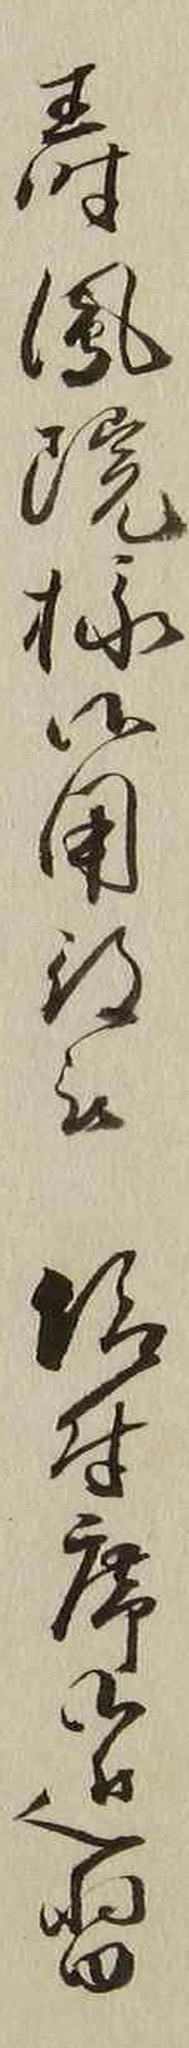寿鳳院様御用役被仰付席御近習
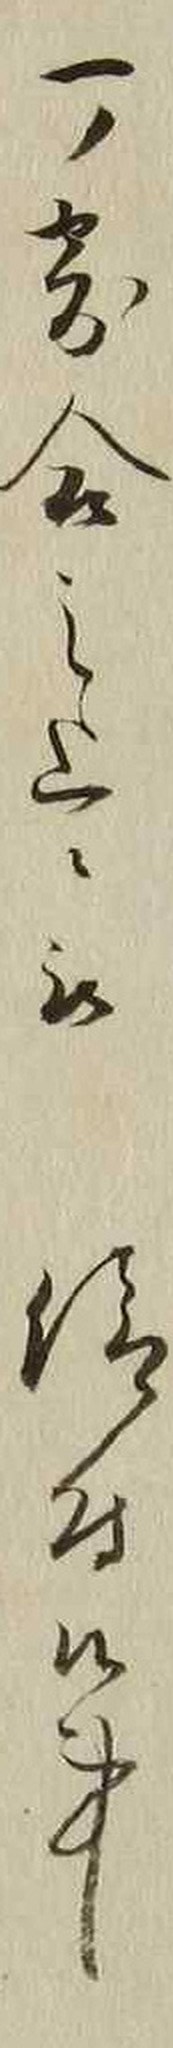一ノ寄合之上ニ被仰付候事
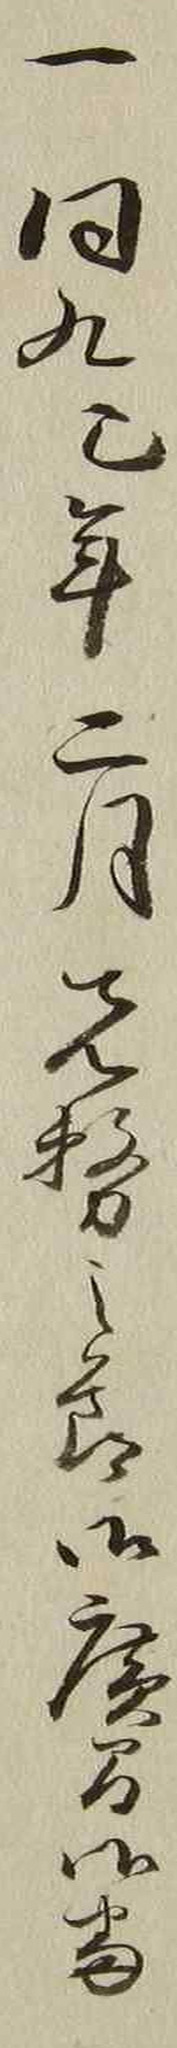一同九巳年二月先務之節御広間御番
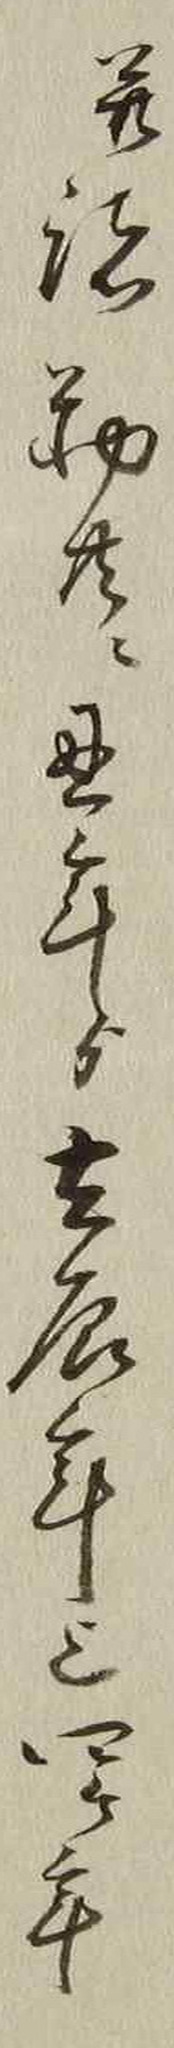并諸勤共ニ丑年ゟ去辰年迄四ケ年
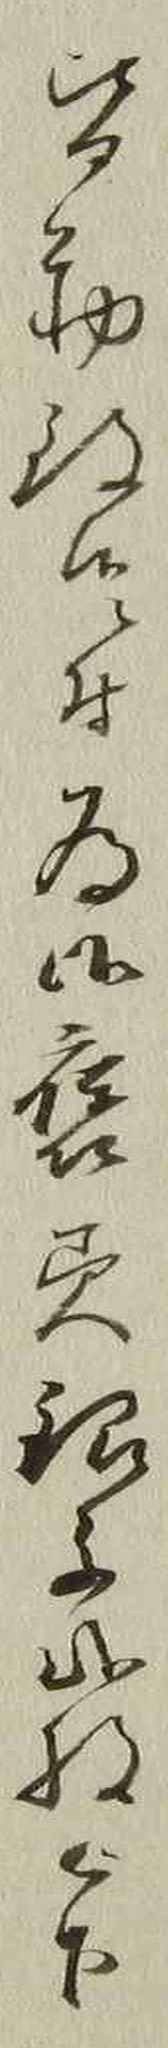皆勤致候ニ付為御褒美銀子弐枚被下
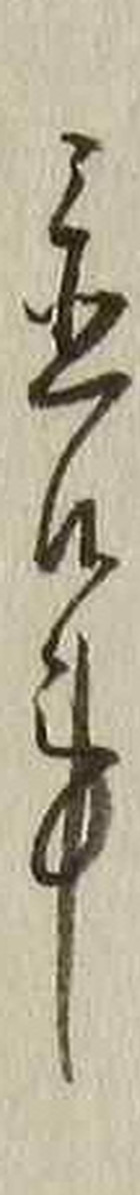置候事
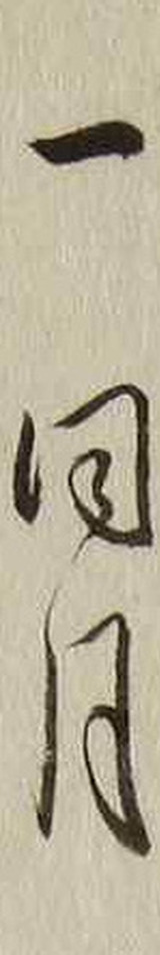一同月
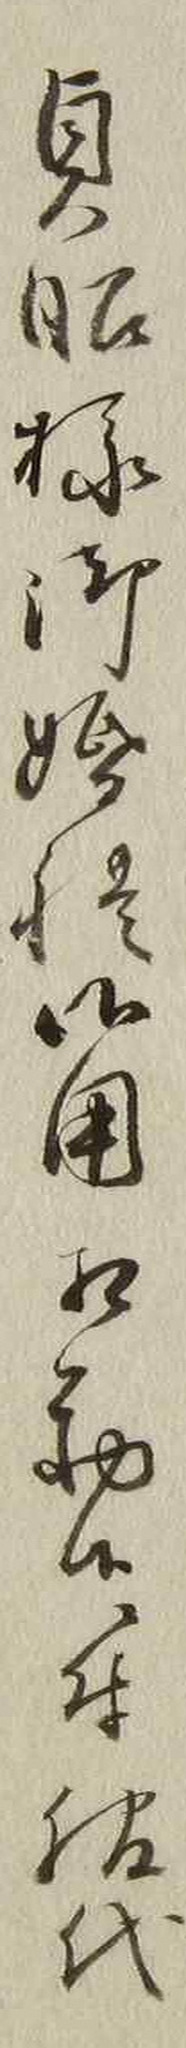貞昭様御婚礼御用相勤候ニ付服代
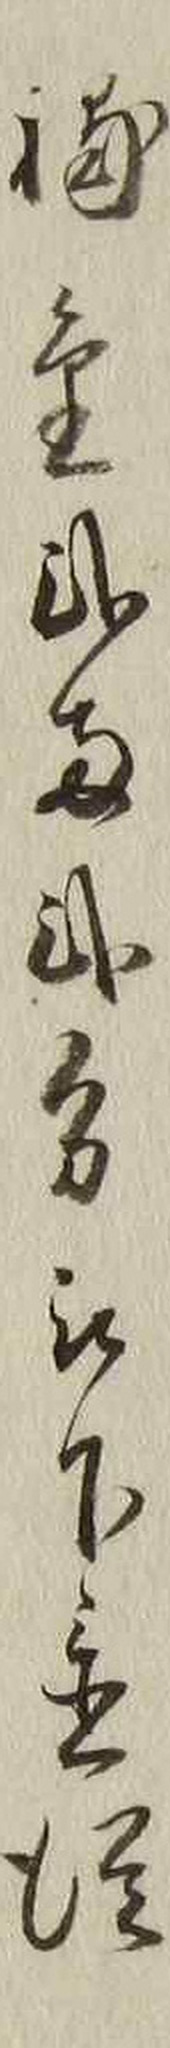補金弐両弐分被下置従
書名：諸士系譜　巻之28　い之部28
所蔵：会津若松市立会津図書館
